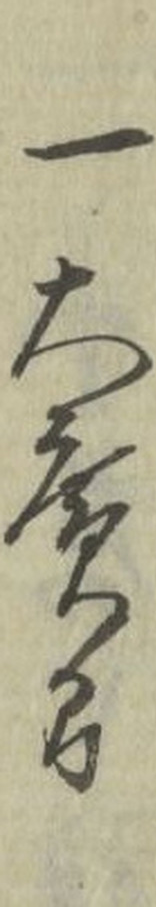一大広間
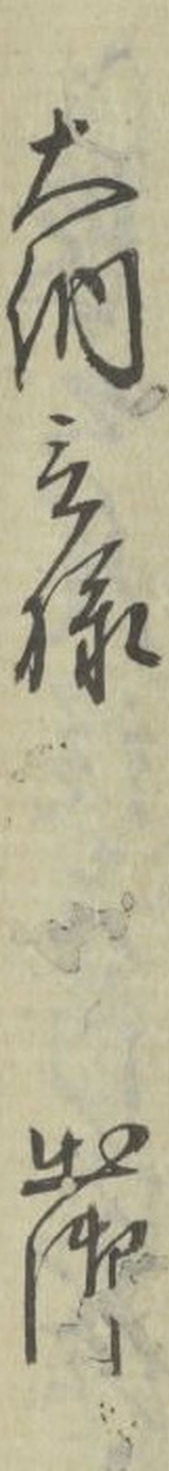大納言様出御
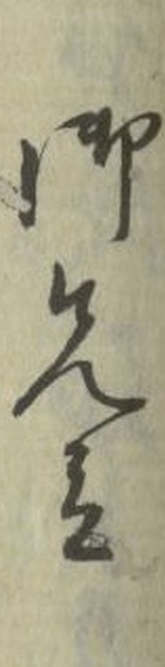御先立
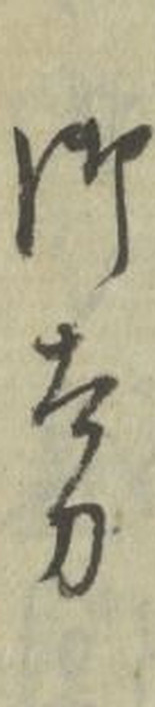御太刀
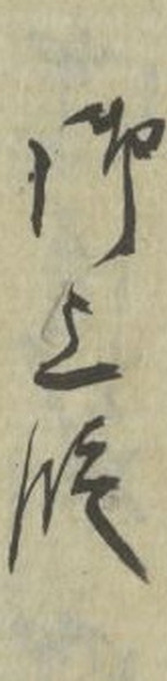御上段
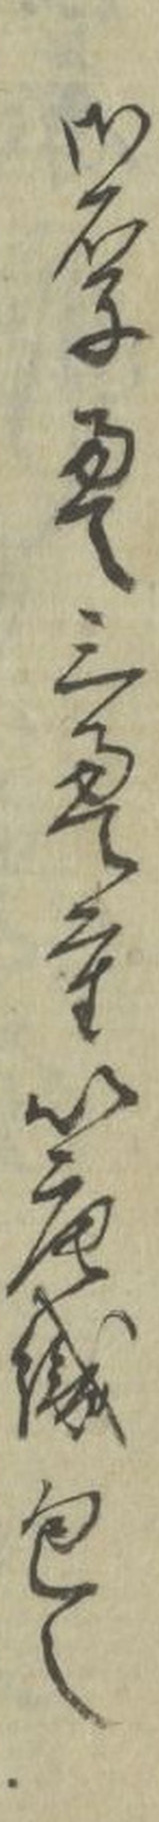御厚畳三畳重以唐織包之
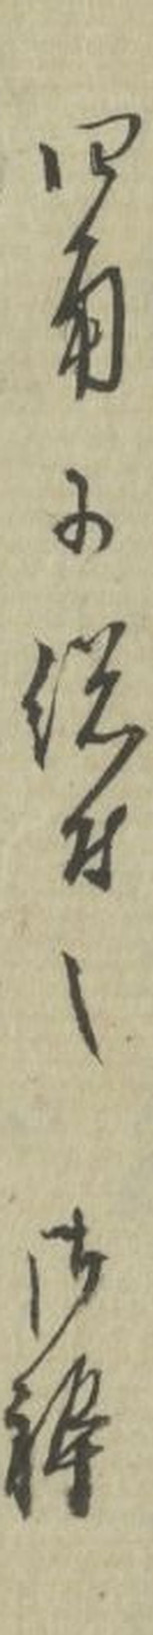四角に総付之御褥
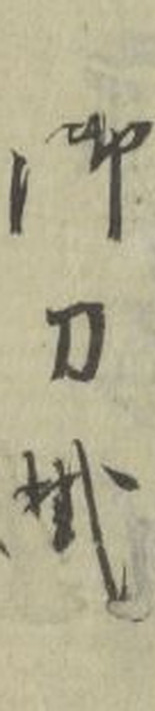御刀掛

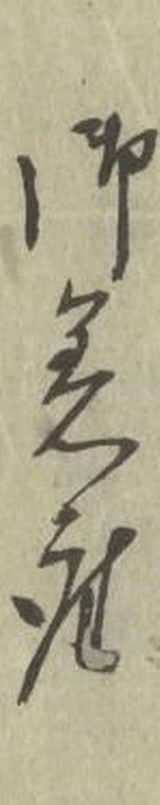御着座
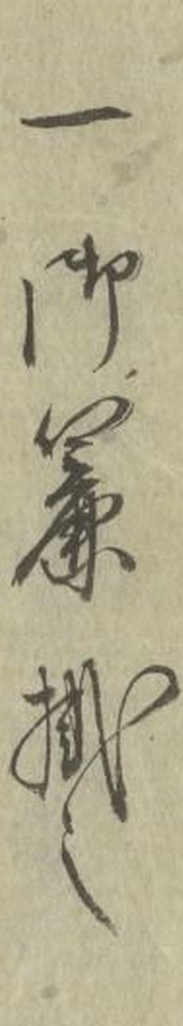一御簾掛之
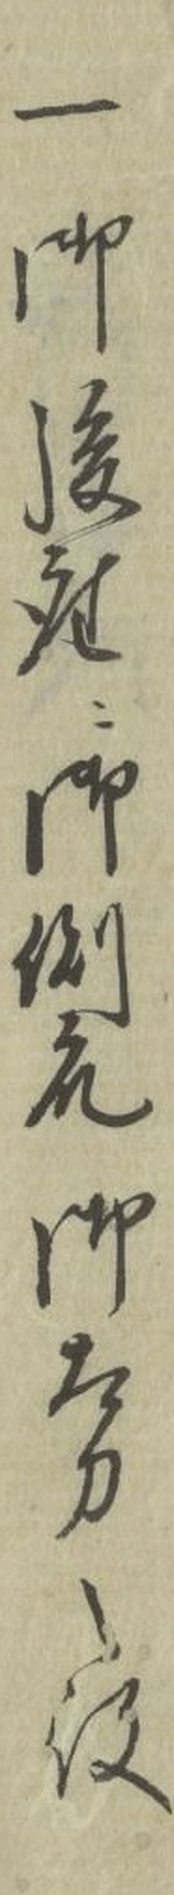一御後座に御側衆御太刀之役
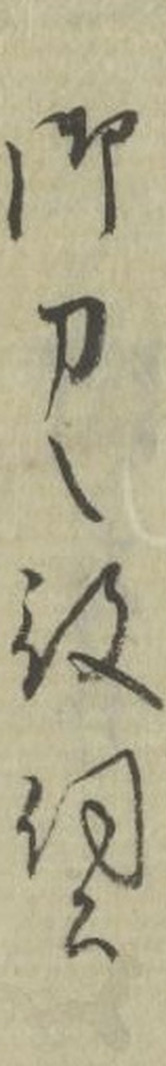御刀之役伺公
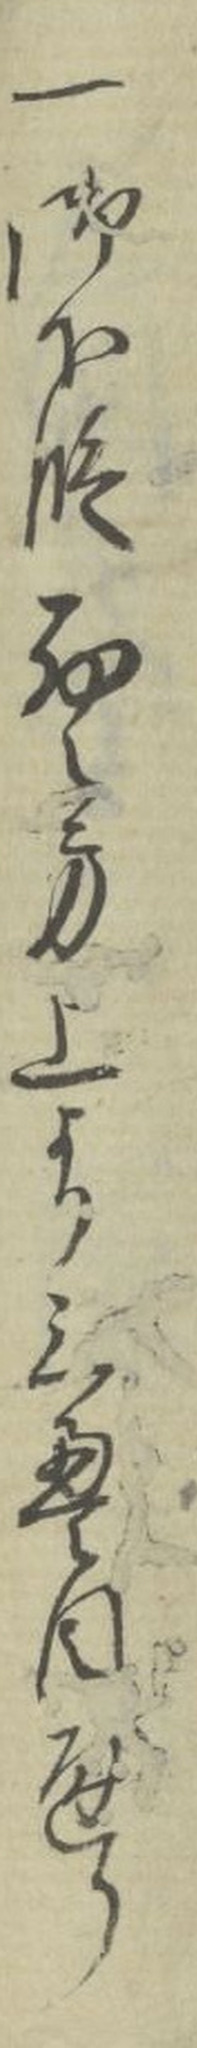一御下段西之方上より三畳目通り
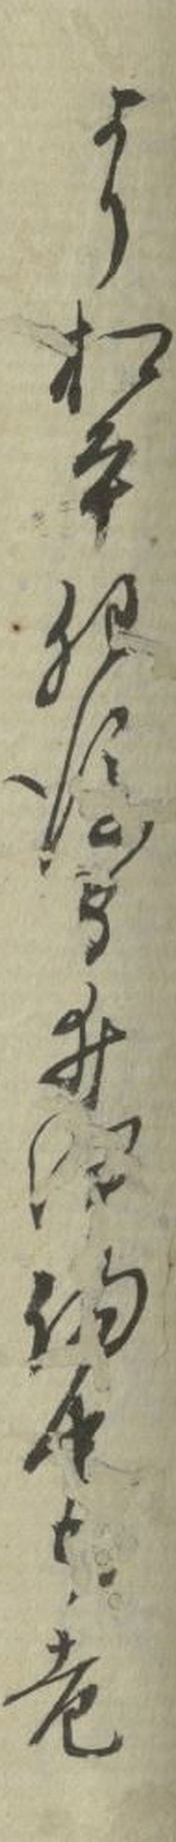より松平肥後守井伊備中守老
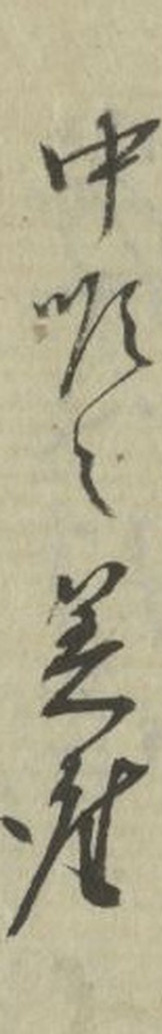中順々着座
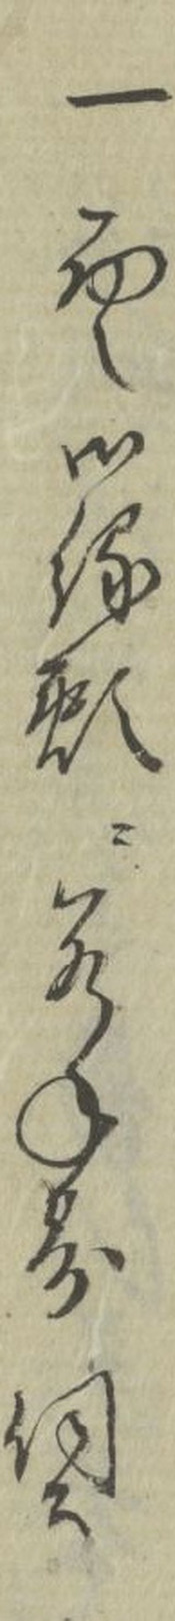一西之縁頬に若年寄伺公
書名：琉球来朝記 自八至十四終
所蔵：University of the Ryukyus Library
